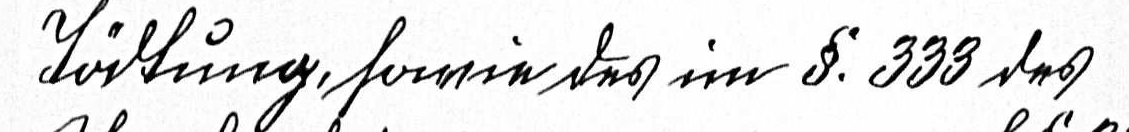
Tödtung, sowie des im §333 des
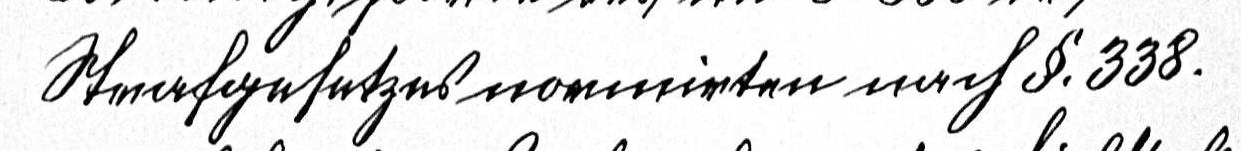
Strafgesetzes normirten nach §338
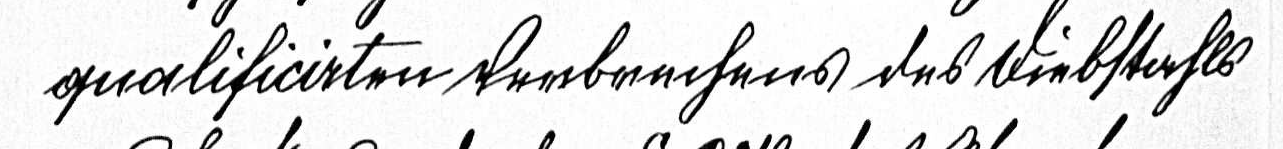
qualificirten Verbrechens des Diebstahls
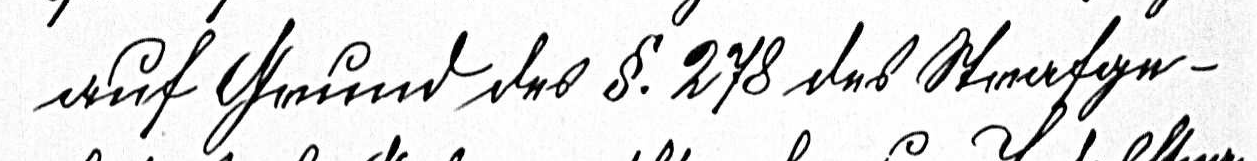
auf Grund des §278 des Strafge¬
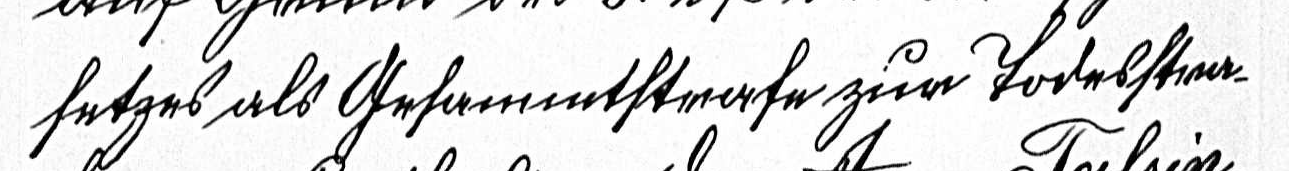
setzes als Gesammtstrafe zur Todesstra¬
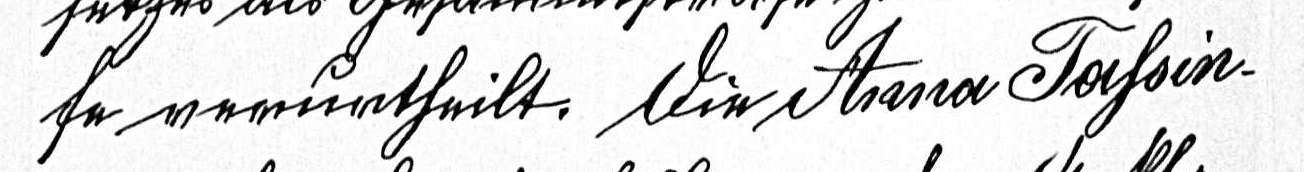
fe verurtheilt. Die Anna Tassin¬
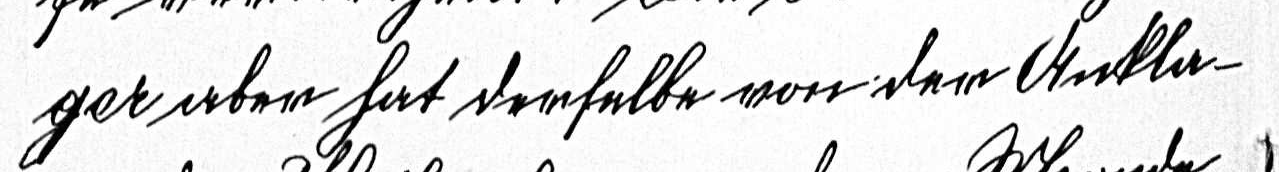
ger aber hat derselbe von der Ankla¬
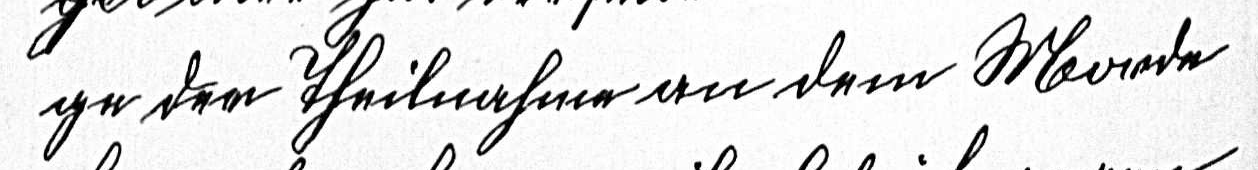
ge der Theilnahme an dem Morde
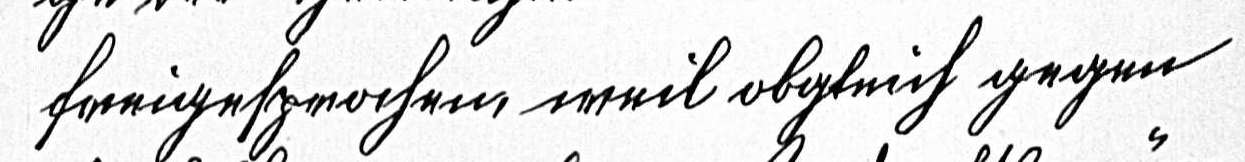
freigesprochen weil obgleich gegen
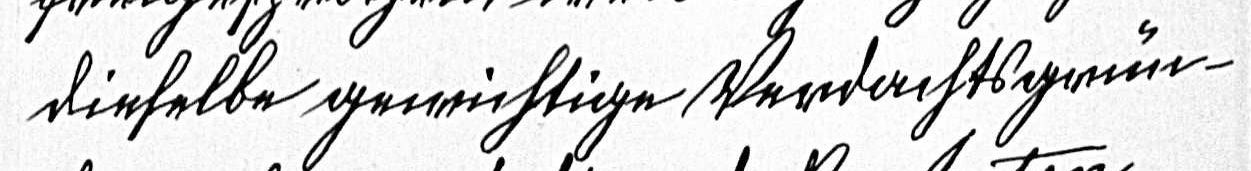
dieselbe gerichtige Verdachtsgrün¬
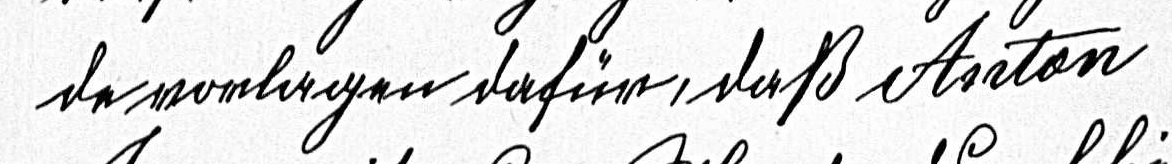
de vorlagen dafür, daß Anton
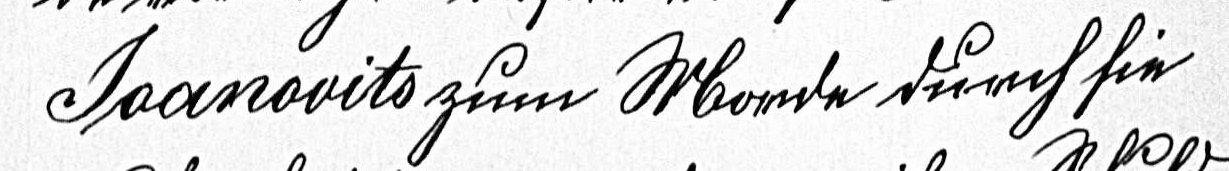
Joanovits zum Morde durch sie
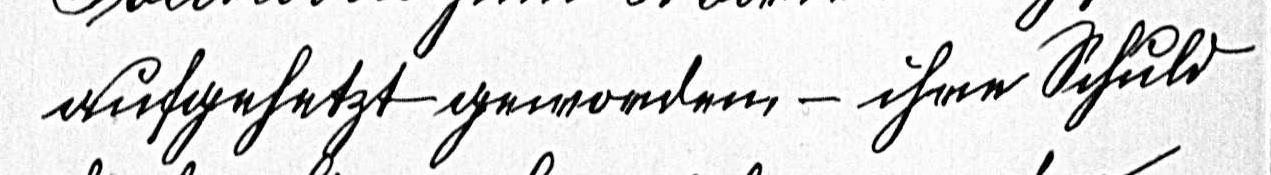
aufgehetzt geworden – ihre Schuld
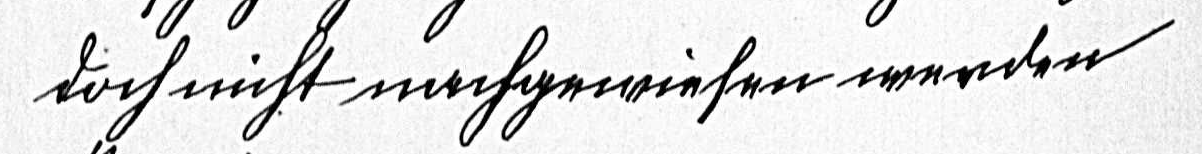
doch nicht nachgewiesen warden
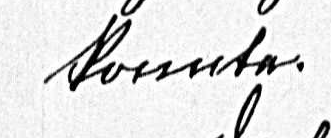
konnte.
